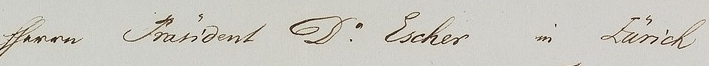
HHerrn Präsident Dr Escher in Zürich
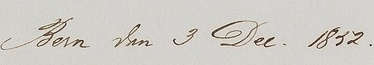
Bern den 3 Dec. 1852.
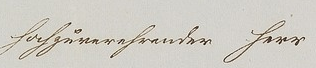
Hochzuverehrender Herr,
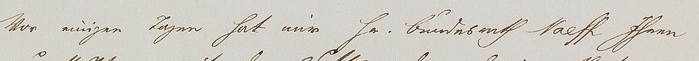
Vor einigen Tagen hat mir Hr. Bundesrath Naeff Ihren
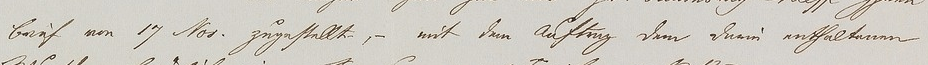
Brief von 17 Nov. zugestellt, – mit dem Auftrag dem darin enthaltenen
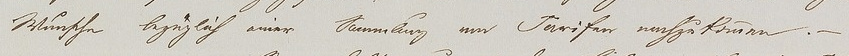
Wunsche bezüglich einer Sammlung von Tarifen nachzukommen. –
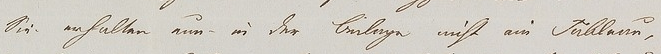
Sie erhalten nun in der Beilage nicht ein Tableau,
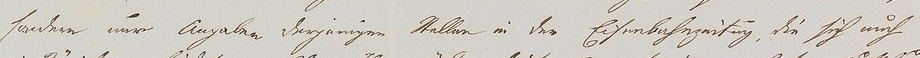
sondern nur Angaben derjenigen Stellen in der Eisenbahnzeitung, die sich auch
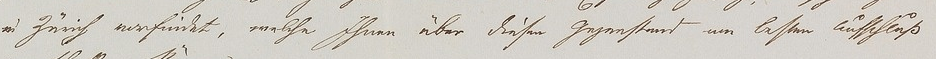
in Zürich vorfindet, welche Ihnen über diesen Gegenstand am besten Aufschluß
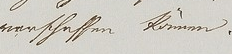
verschaffen können. –
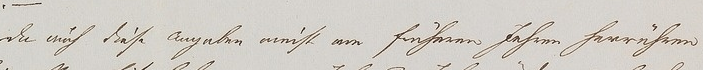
Da auch diese Angaben meist von früheren Jahren herrühren
